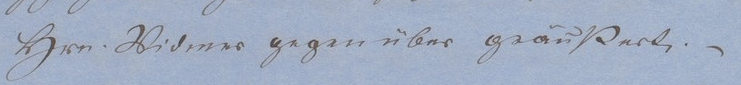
Hrn. Widmer gegenüber geäußert. –
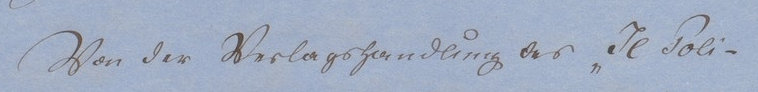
Von der Verlagshandlung des «Il Poli-
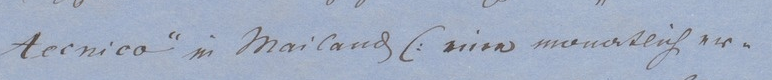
tecnico» in Mailand (: eine monatlich er-
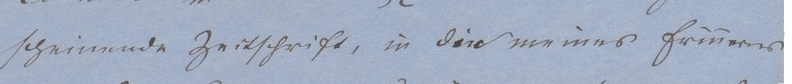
scheinende Zeitschrift, in die meines Erinnerns
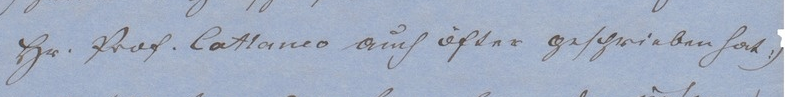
Hr. Prof. Cattaneo auch öfter geschrieben hat:)
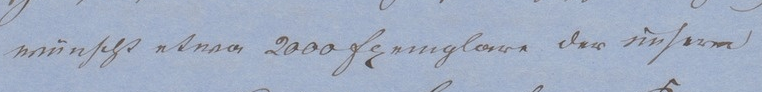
wünscht etwa 2000 Exemplare der unserm
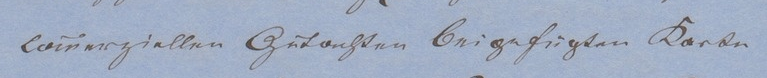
commerziellen Gutachten beigefügten Karte
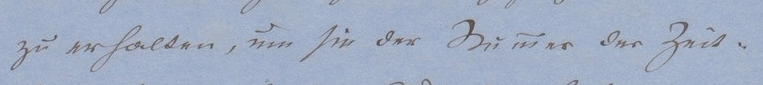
zu erhalten, um sie der Nummer der Zeit-
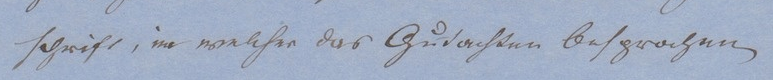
schrift, in welcher das Gutachten besprochen
